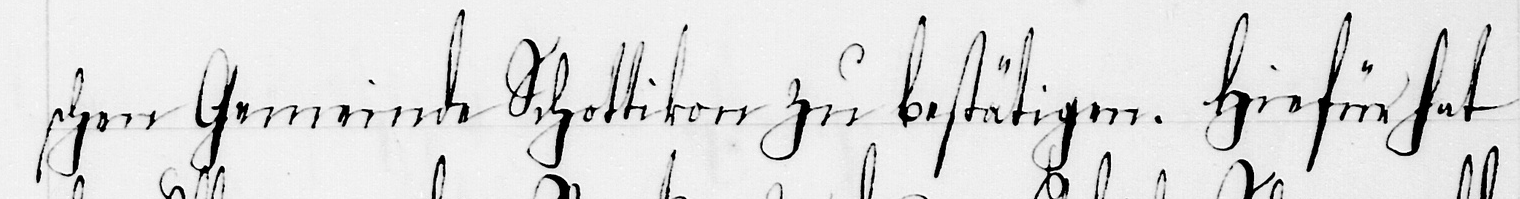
schen Gemeinde Schottikon zu bestätigen. Hiefür hat
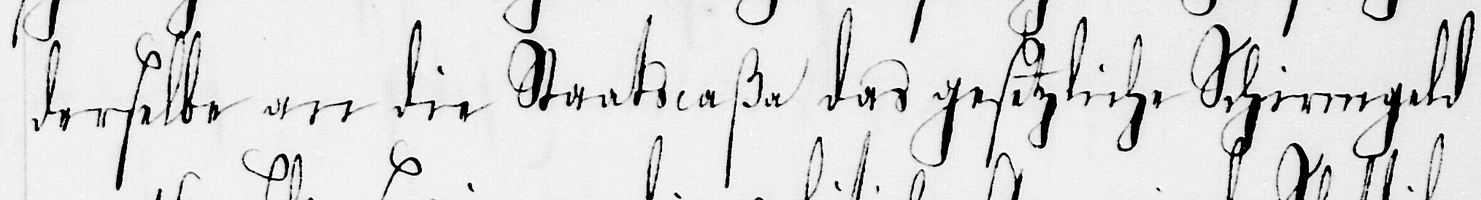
derselbe an die Staatscaßa das gesetzliche Schirmgeld
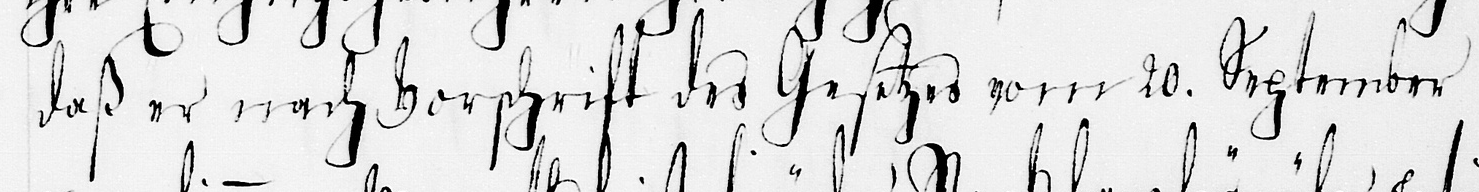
daß er nach Vorschrift des Gesetzes vom 20. September
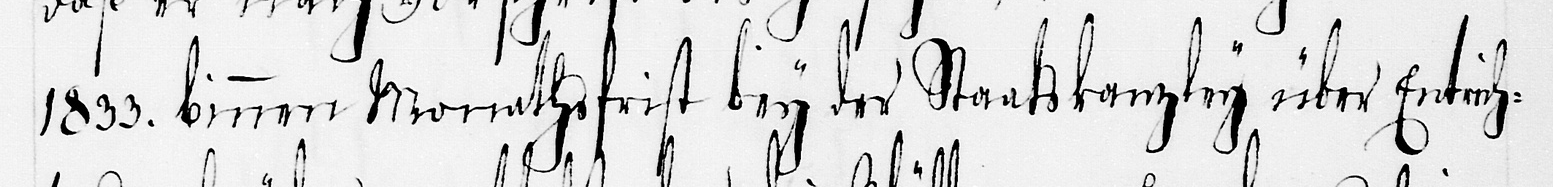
1833. binnen Monathsfrist bey der Staatskanzley über Entrich¬
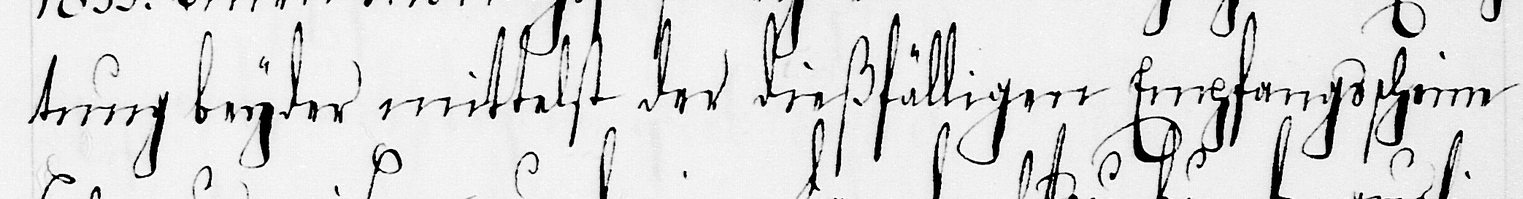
tung beyder mittelst der dießfälligen Empfangsscheine
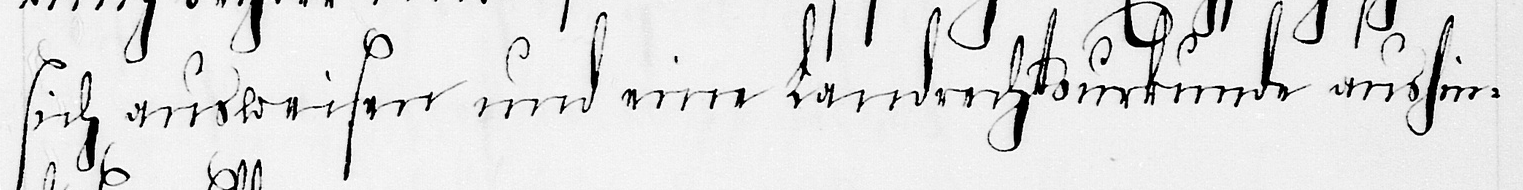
sich ausweisen und eine Landrechtsurkunde aushin¬
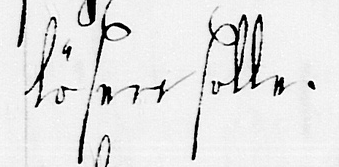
lösen solle.
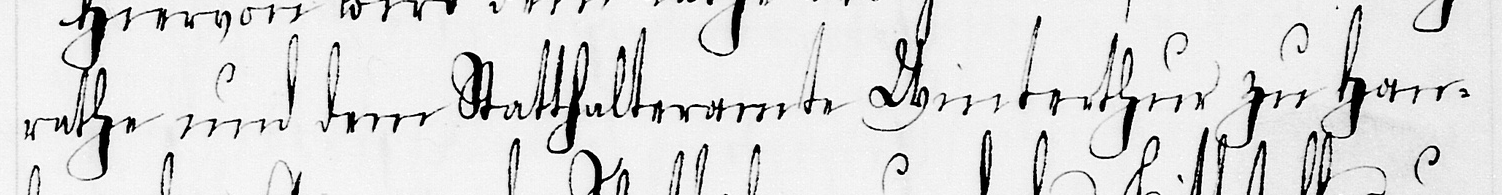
rathe und dem Statthalteramte Winterthur zu Han¬
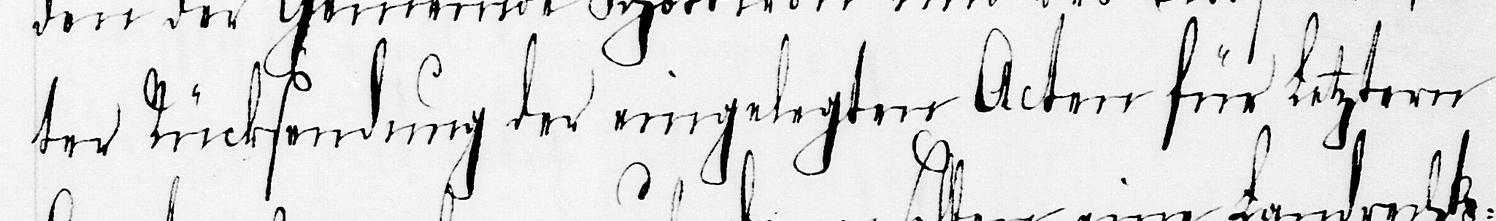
ter Rücksendung der eingelegten Acten für Letztern
